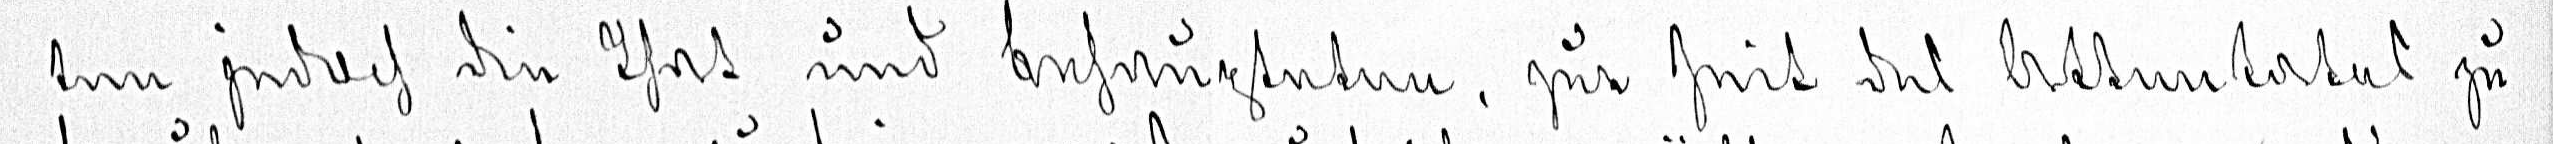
ten jedoch die That und behaupteten, zur Zeit des Attentates zu
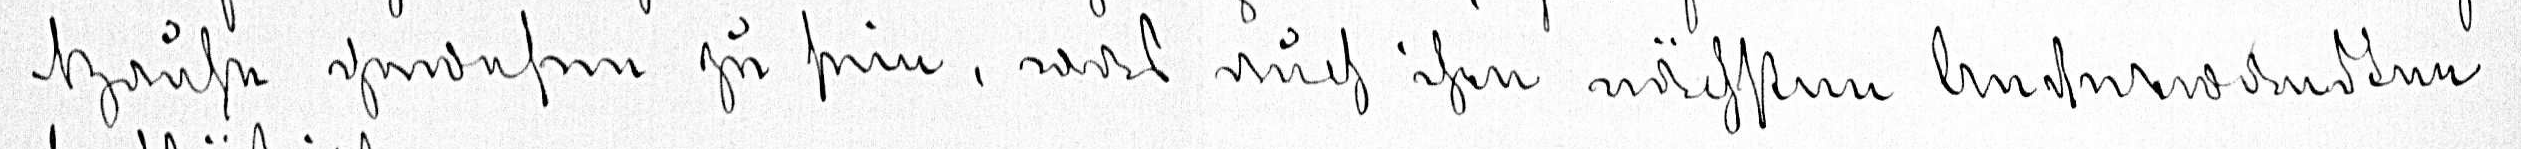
Hause gewesen zu sein, was auch ihre nächsten Anverwandten
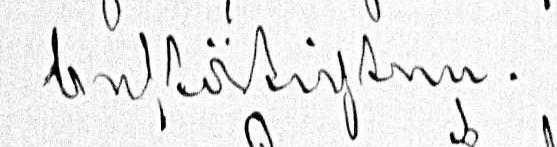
bestätigten.
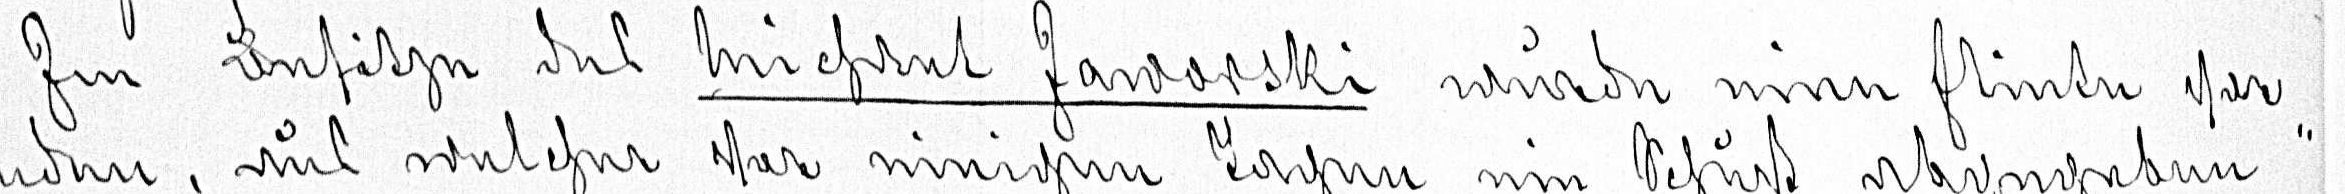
Zu Besitze des Michael Jaworski wurde eine Flinte vor¬
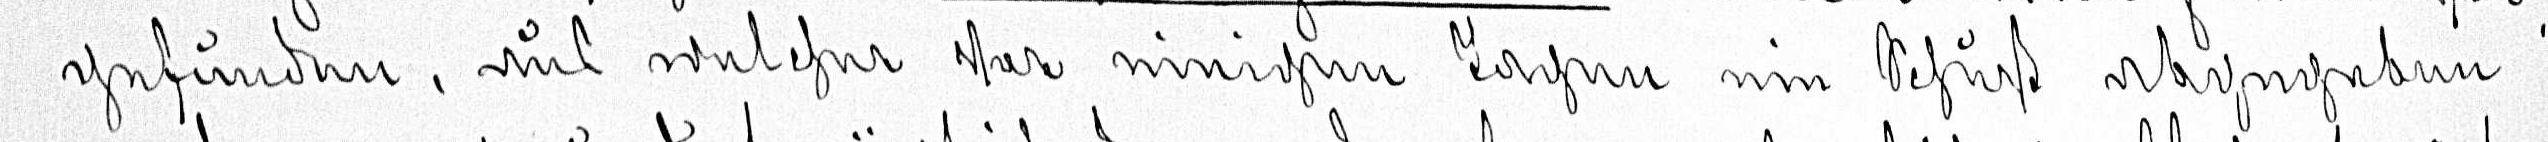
gefunden, aus welcher vor einigen Tagen ein Schuß abgegeben
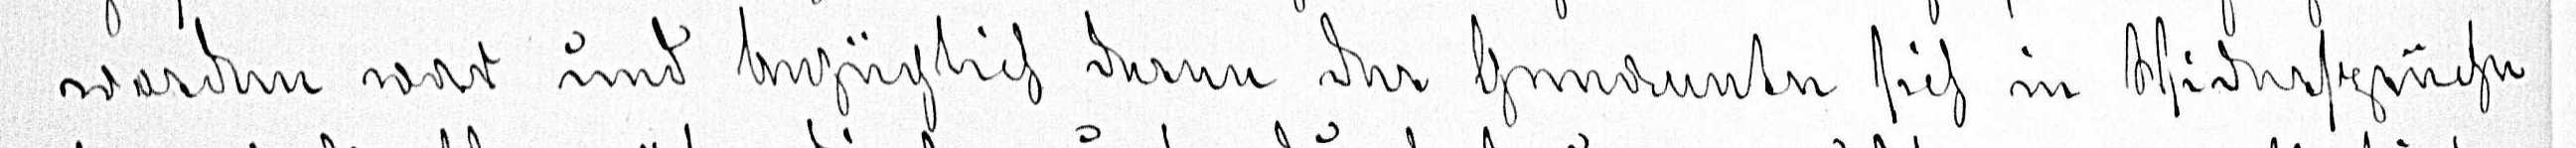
worden war und bezüglich deren der Genannte sich in Widersprüche
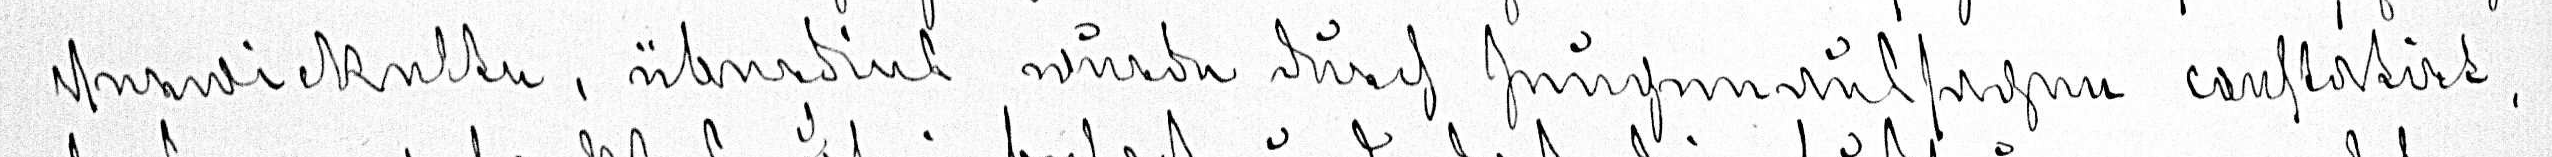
verwickelte, überdies wurde durch Zeugenaussagen constatirt,
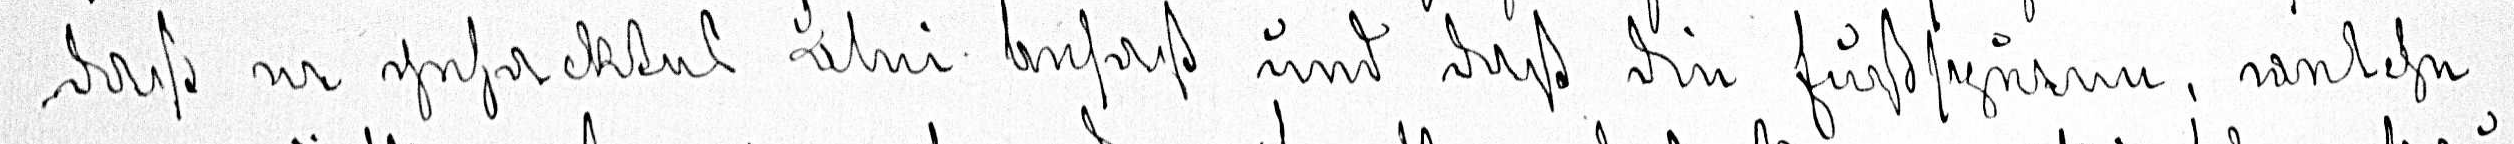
daß er gehacktes Blei besaß und daß die Fußspuren, welche
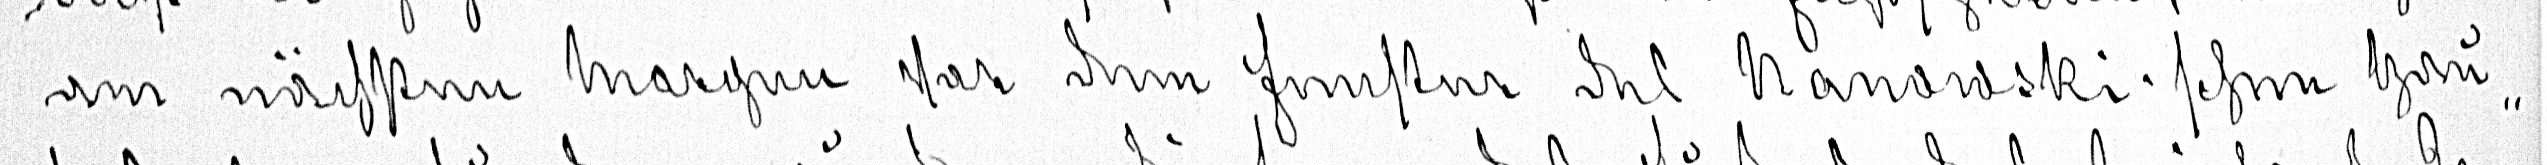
am nächsten Morgen vor dem Fenster des Nanowski’schen Hau¬
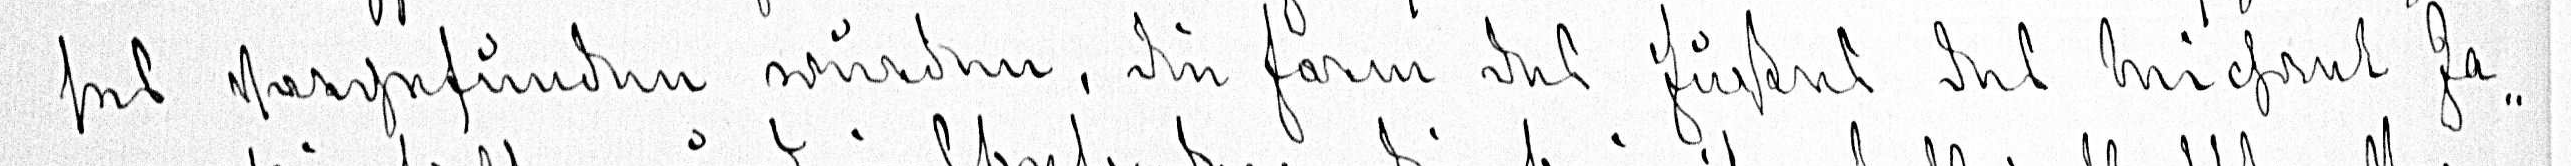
ses vorgefunden wurden, die Form des Fußes des Michael Ja¬
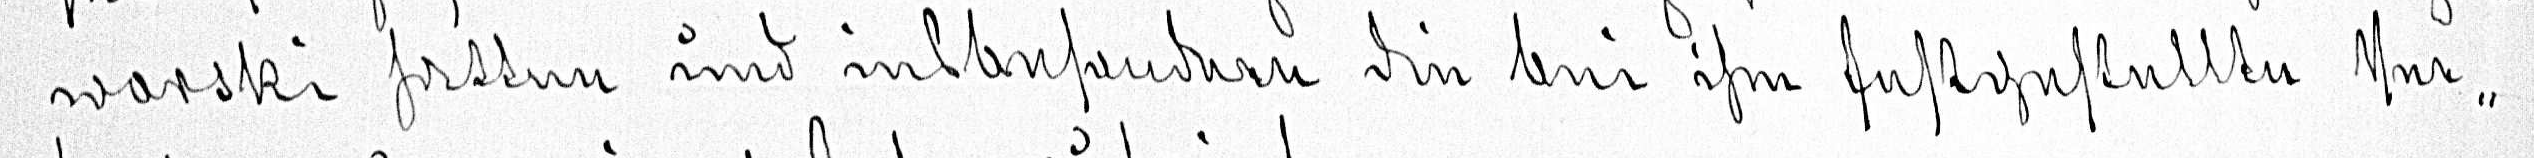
worski hatten und insbesondere die bei ihm festgestellten Ver¬
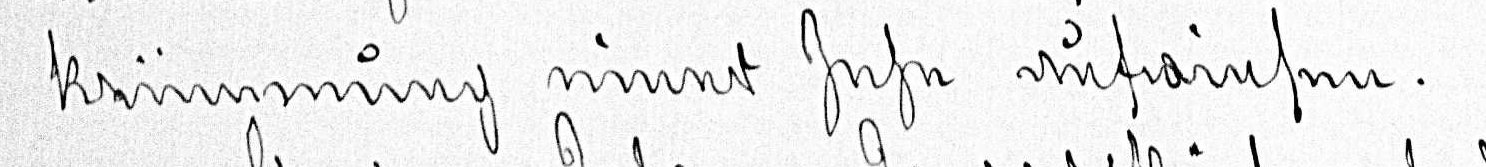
krümmung eines Zehe aufwiesen.
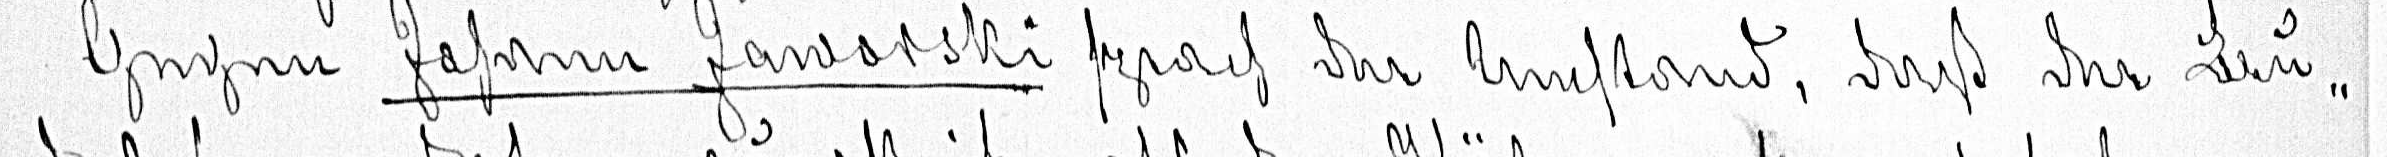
Gegen Johann Jaworski sprach der Umstand, daß der Bru¬
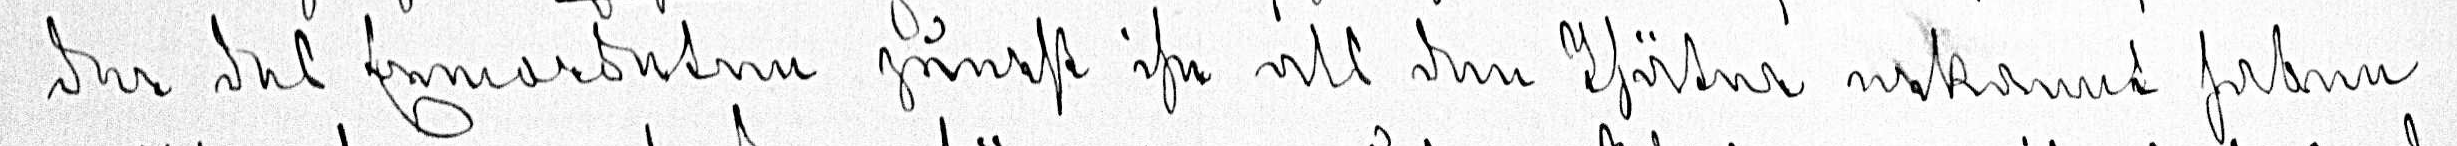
der des Ermordeten zuerst ihn als den Thäter erkannt jeden
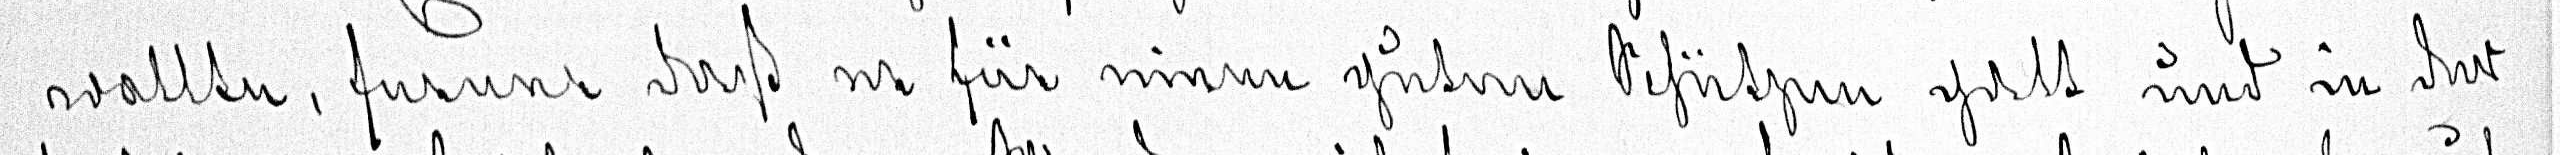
wollte, ferner daß es für einen guten Schützen galt und in der
